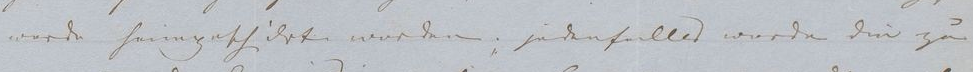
werde heimgeschikt werden; jedenfalls werde die zu
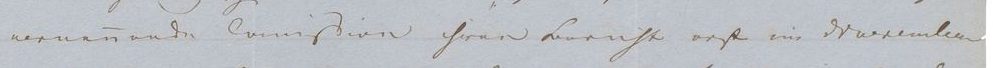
ernennende Comission ihren Bericht erst im November
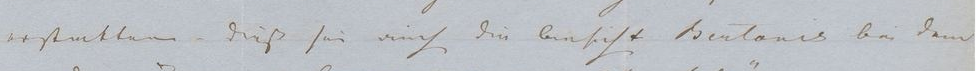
erstatten – dieß sei auch die Ansicht Bertanis bei dem
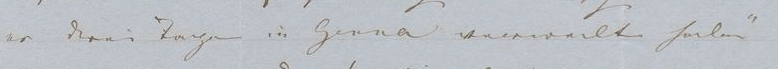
er drei Tage in Genua verweilt habe».
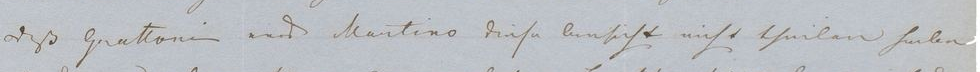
Daß Grattoni und Martino diese Ansicht nicht theilen habe
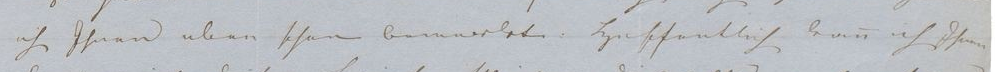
ich Ihnen eben schon bemerkt: Hoffentlich kann ich Ihnen
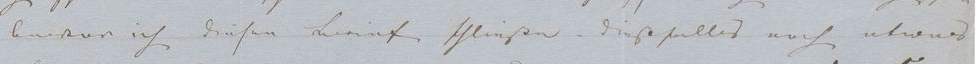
bevor ich diesen Brief schließe – dießfalls noch etwas
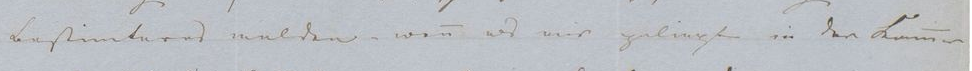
Bestimteres melden – wenn es mir gelingt in der Kammer
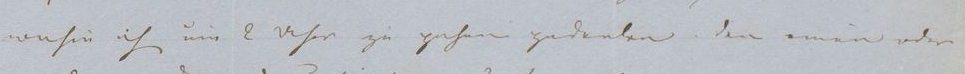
wohin ich um 2 Uhr zu gehen gedenke – den einen oder
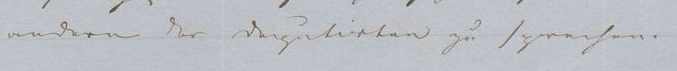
andern der Deputirten zu sprechen. –
